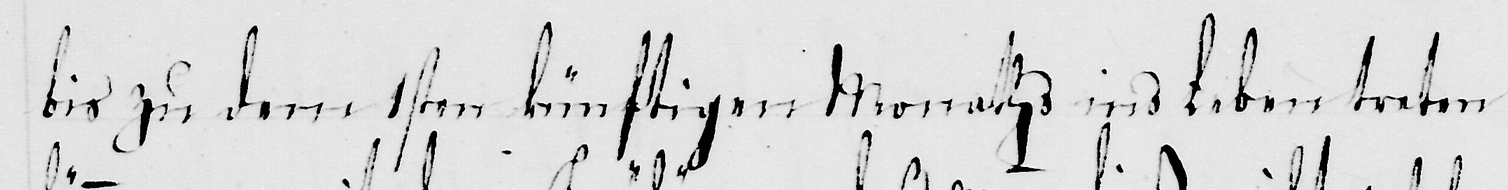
bis zu dem 1sten künftigen Monaths ins Leben treten
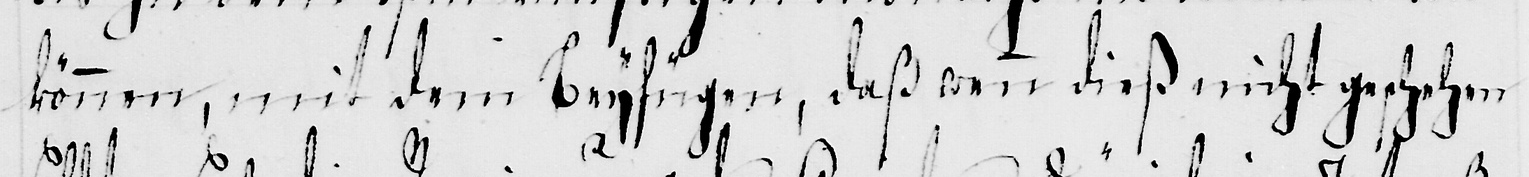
können, mit dem Beyfügen, daß wenn dieß nicht geschehen
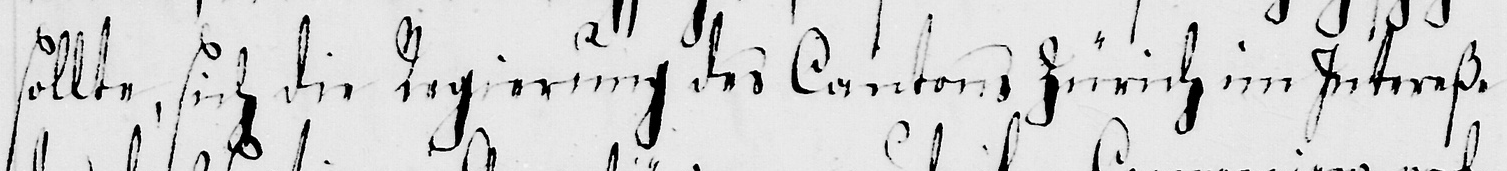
sollte, sich die Regierung des Cantons Zürich im Intereße
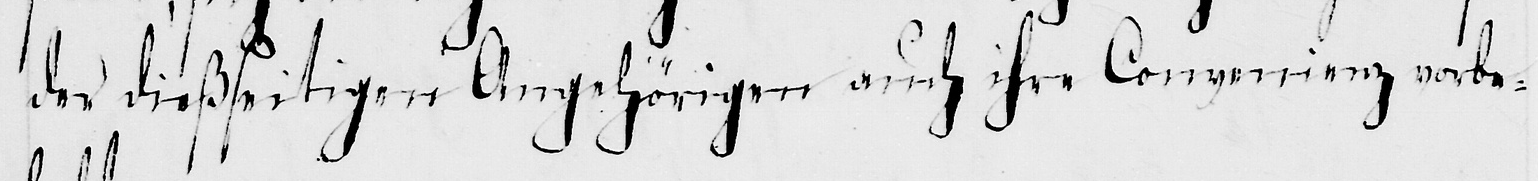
der dießseitigen Angehörigen auch ihre Convenienz vorbe¬
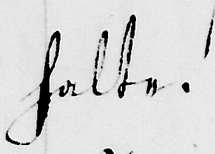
halte.
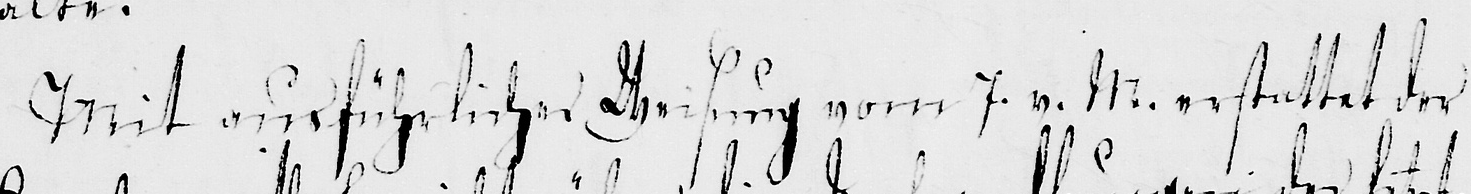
Mit ausführlicher Weisung vom 7. v. M. erstattet der
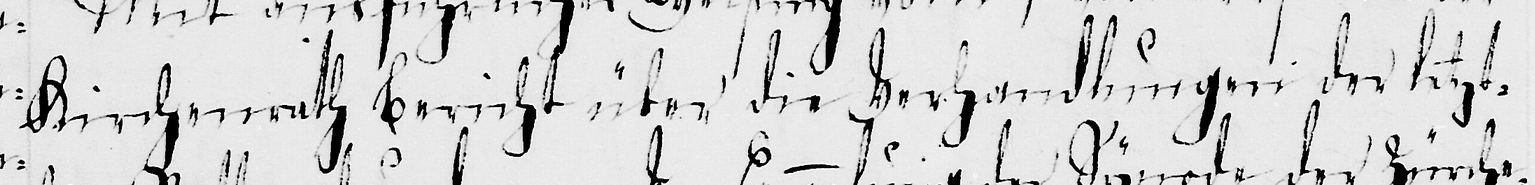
Kirchenrath Bericht über die Verhandlungen der letzt¬
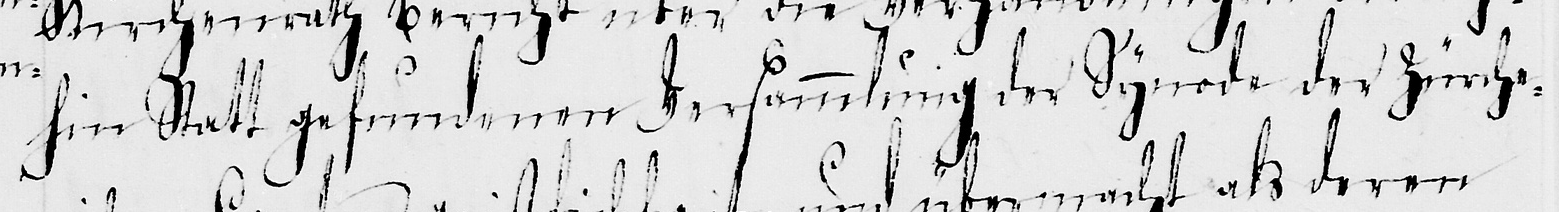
hin Statt gefundenen Versammlung der Synode der Zürche¬
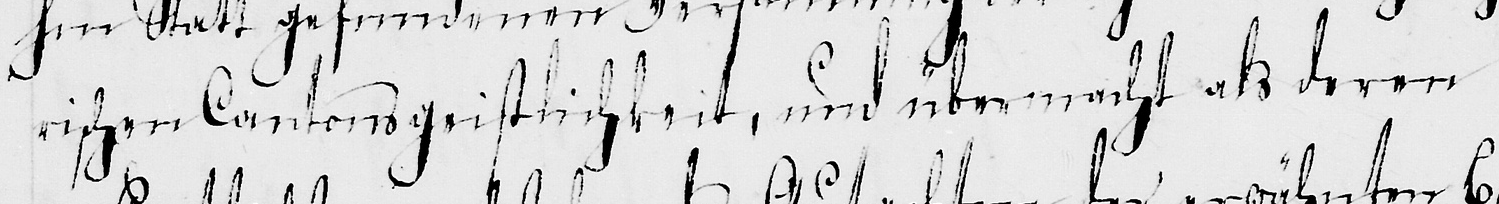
rischen Cantonsgeistlichkeit, und übermacht als deren
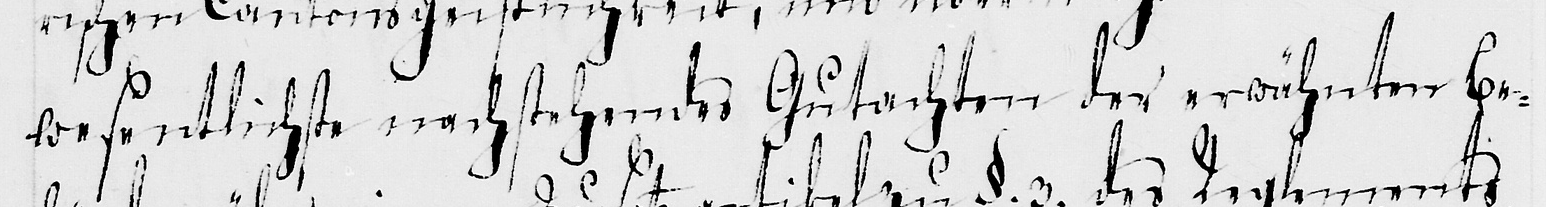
wesentlichste nachstehendes Gutachten der erwähnten Be¬
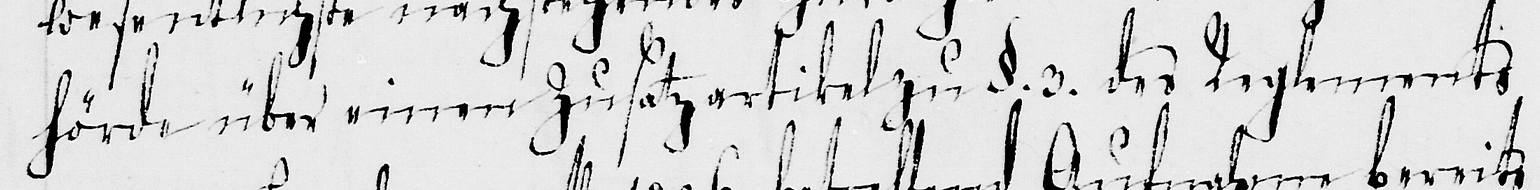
hörde über einen Zusatzartikel zu §. 3. des Reglements
